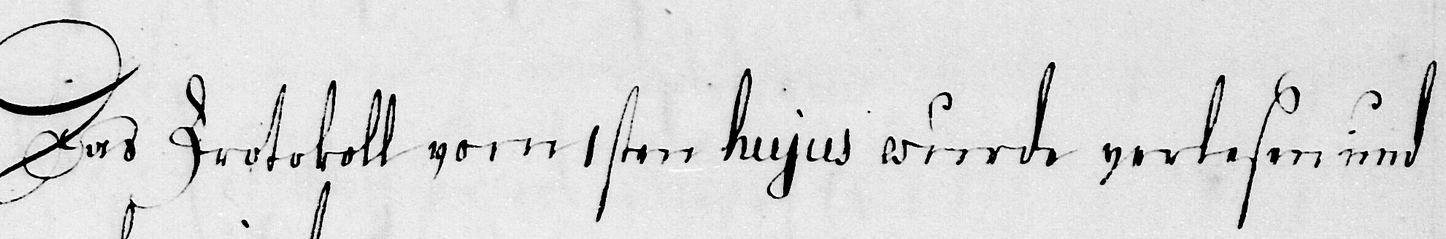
Das Protokoll vom 1sten hujus wurde verlesen und
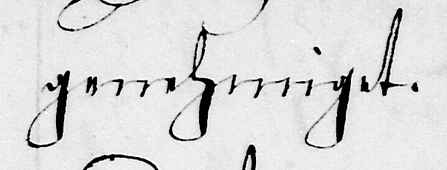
genehmiget.
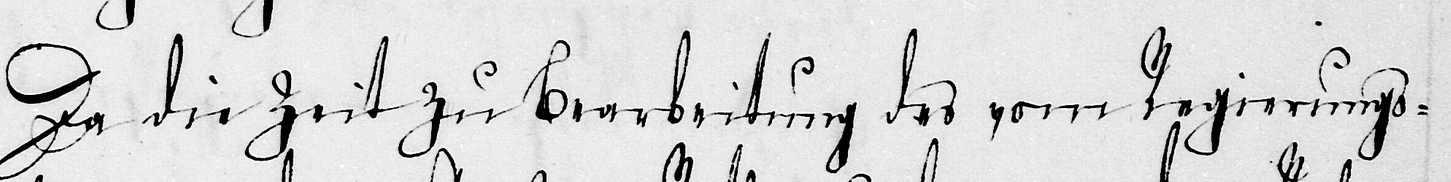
Da die Zeit zu Bearbeitung des vom Regierungs¬
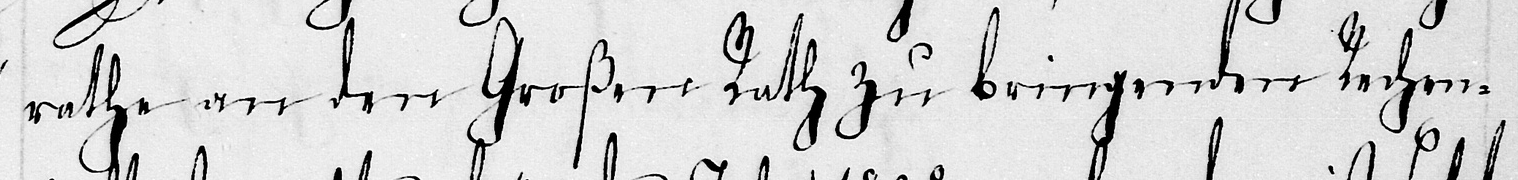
rathe an den Großen Rath zu bringenden Rechen¬
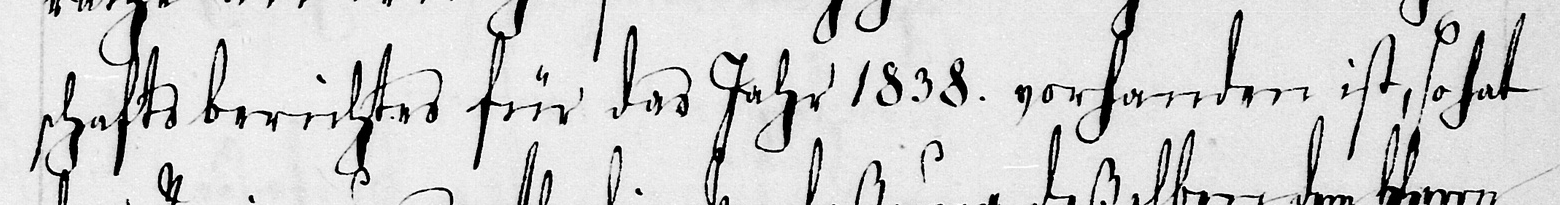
schaftsberichtes für das Jahr 1838. vorhanden ist, so hat
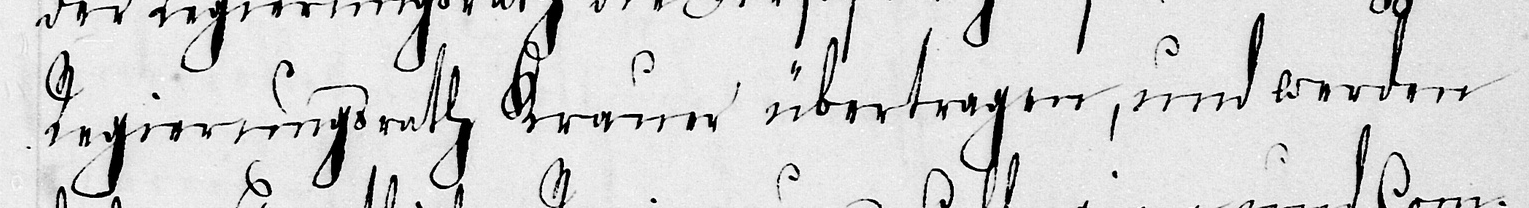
Regierungsrath Krauer übertragen, und werden
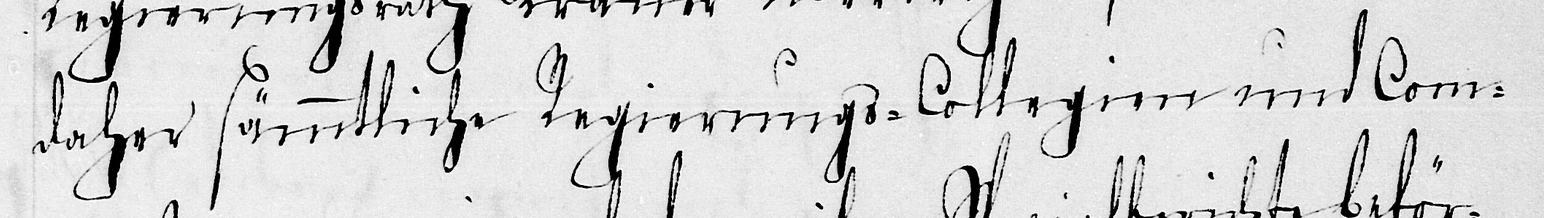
daher sämmtliche Regierungs-Collegien und Com¬
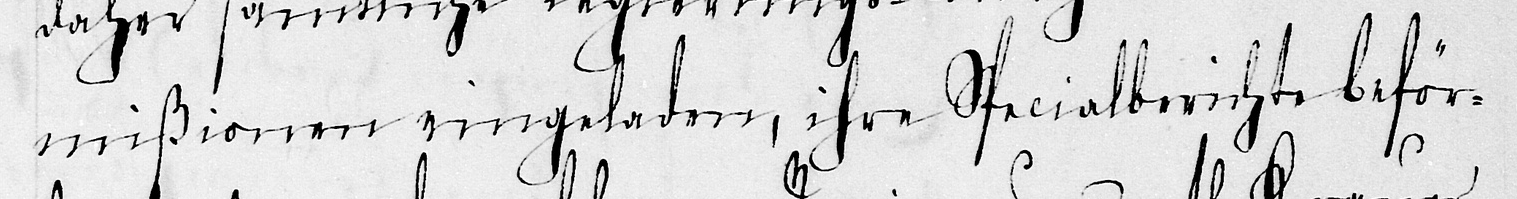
mißionen eingeladen, ihre Spezialberichte beför¬
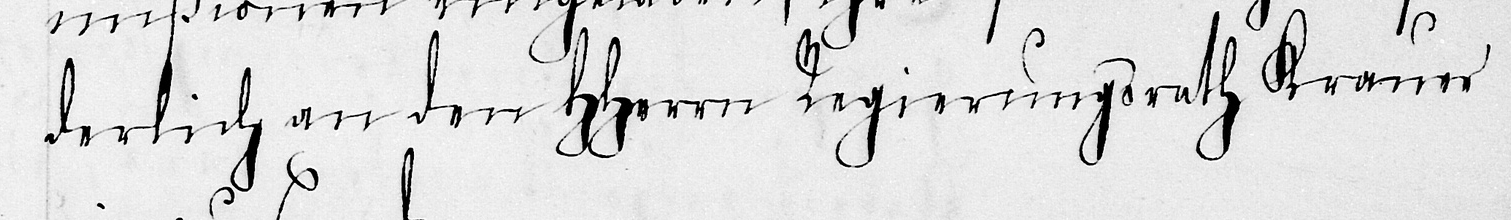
derlich an den HHerrn Regierungsrath Krauer
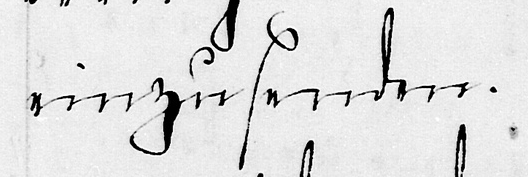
einzusenden.
